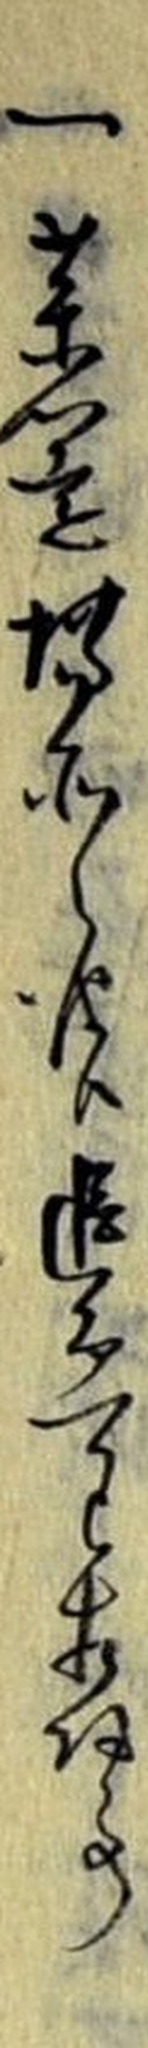一薬薗場所之儀は追而可被相伺事

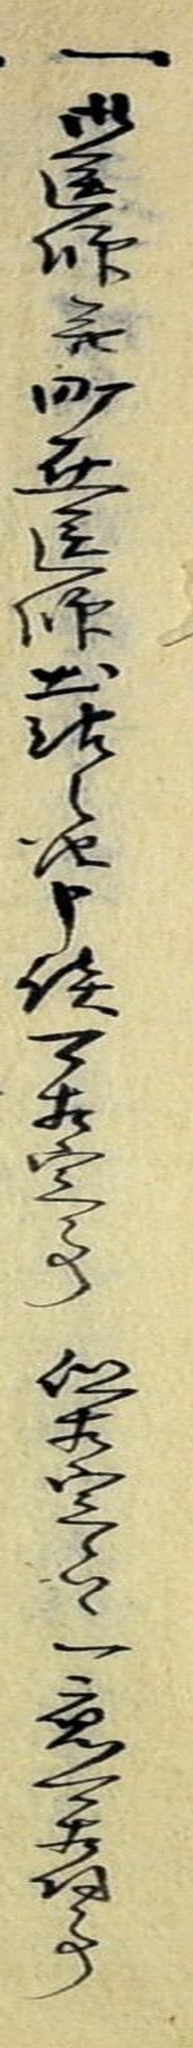一御医師并町在医師出銀之儀申談可相定事但相定候はヽ一應可相伺事
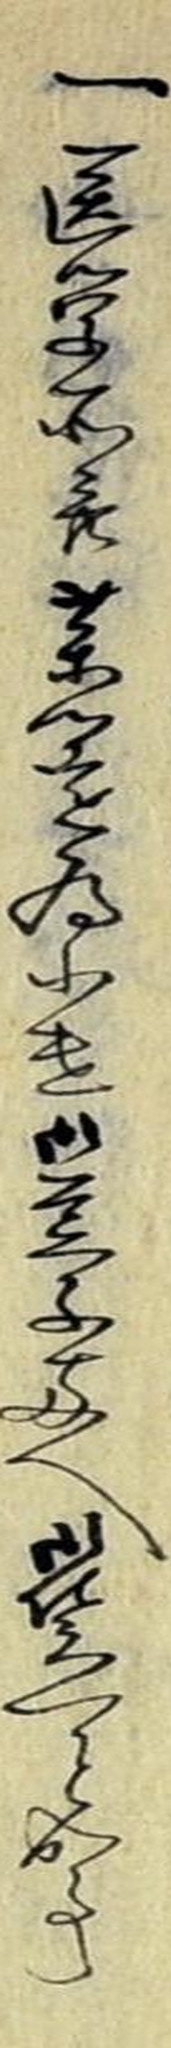一医学所并薬薗為小遣御荒子両人御貸可被成事
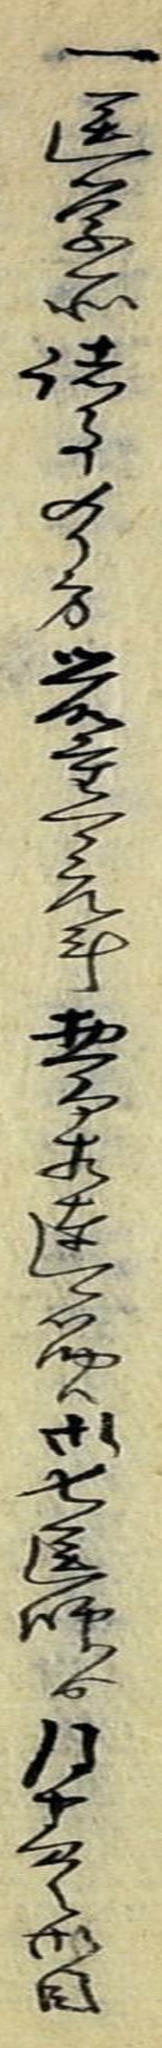一医学所諸事〆り方厳重可取斗惣而相達候筋は御匙医師ゟ月番之御目
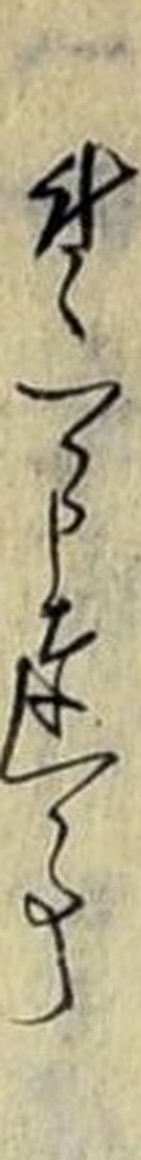付へ可申達事
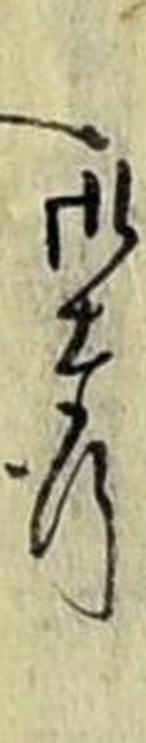御奉行
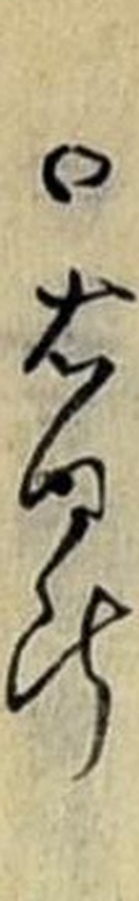○右同断
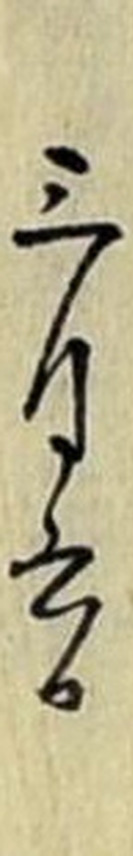三月六日
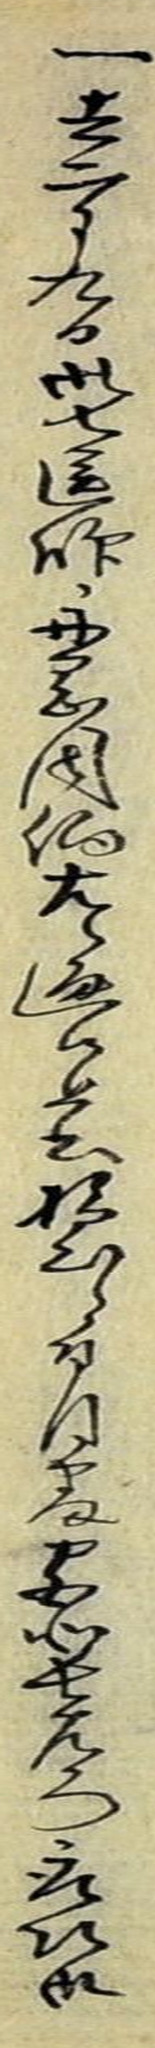一去二月九日御匙医師舟岡周伯左之通口上書指出候に付月番番所七左衛門取次御
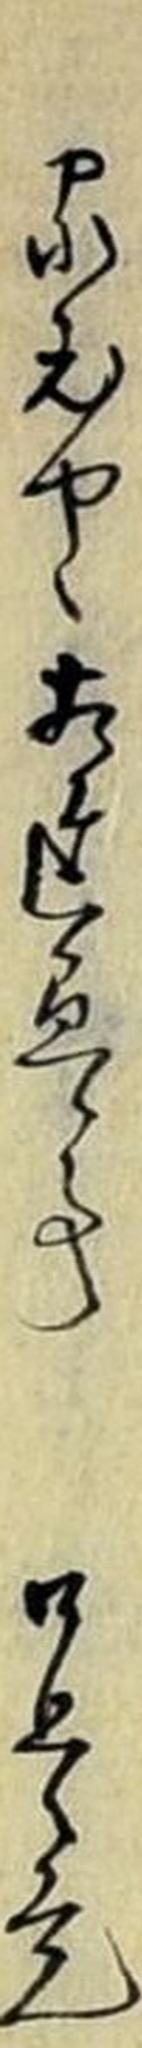家老中へ相達置候事口上覚
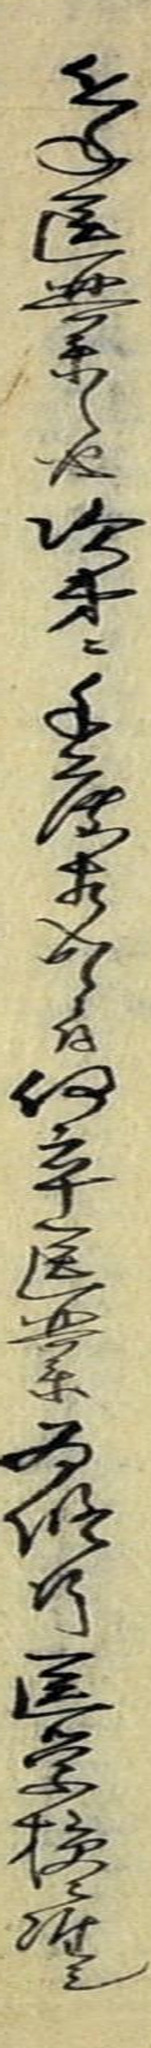近年医業等之儀次第に手薄相成候に付何卒医業為修行医学校に准し
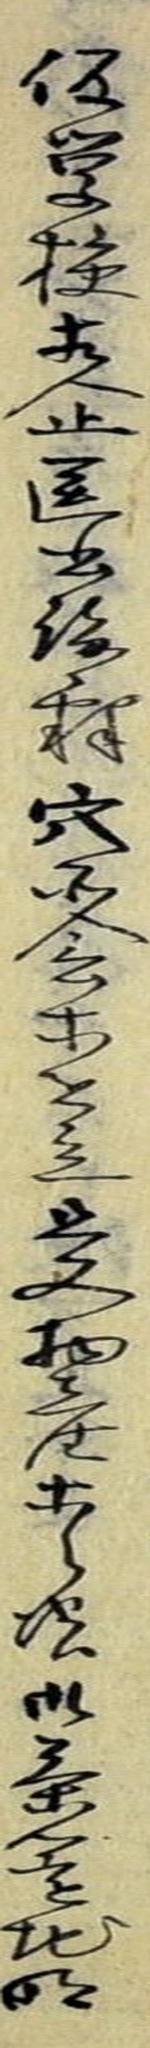仮学校相企医書講釈穴所会等を立且又物産等之儀は御茶薗地明
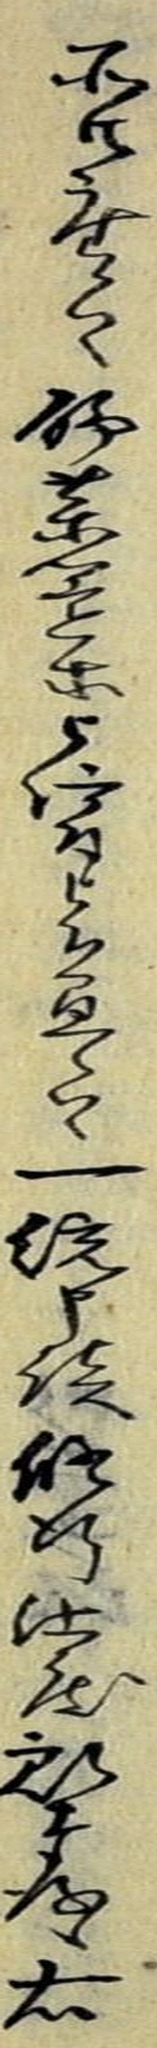所御座候はヽ聊薬薗等被仰付被下置候はヽ一統申談修行仕度願奉存候右
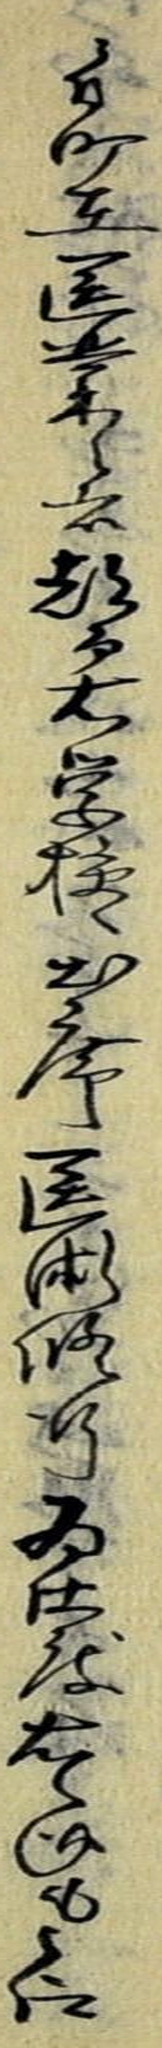に付町在医学等之者都而右学校へ出席医術修行為仕度右之趣も被仰
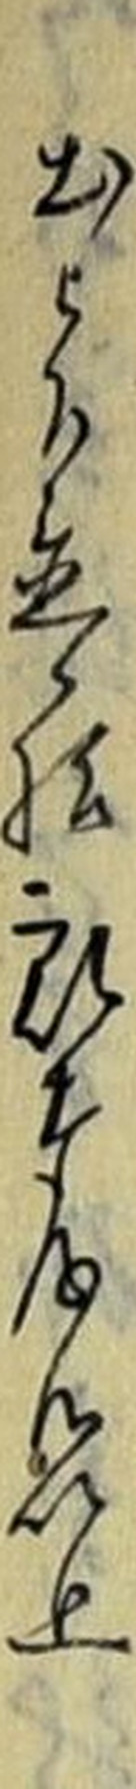出被下置候様願奉存候以上
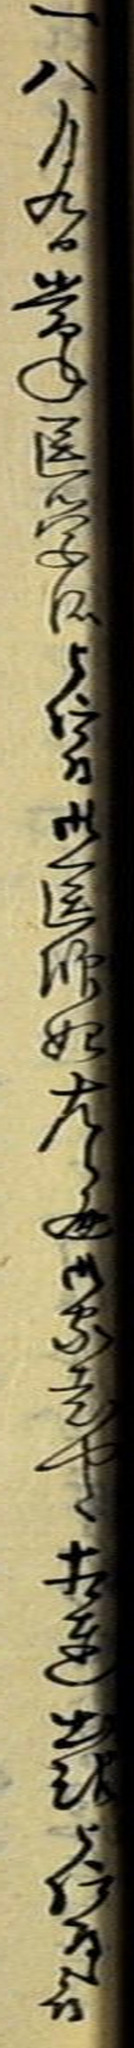一八月九日当年医学所被仰付御医師始左之通御家老中へ相達出銀被仰付候に付
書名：命令之部 四
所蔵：福井県文書館 Fukui Prefectural Archives
